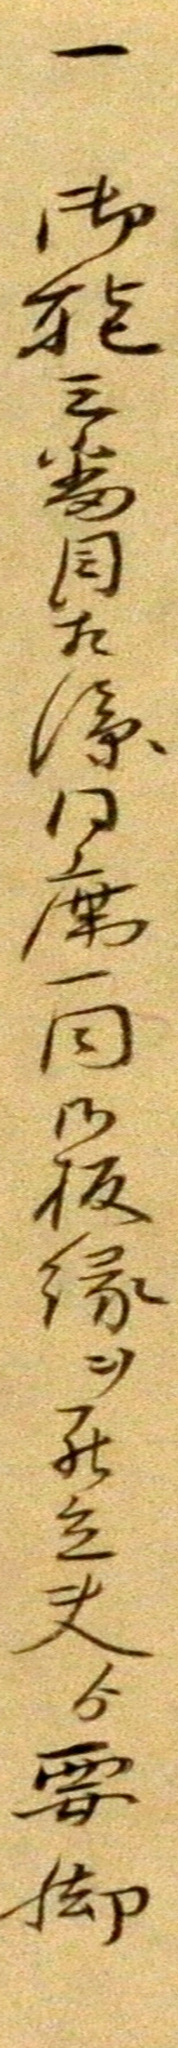一御能三番目相済同席一同御板縁ヲ罷立夫ゟ要脚
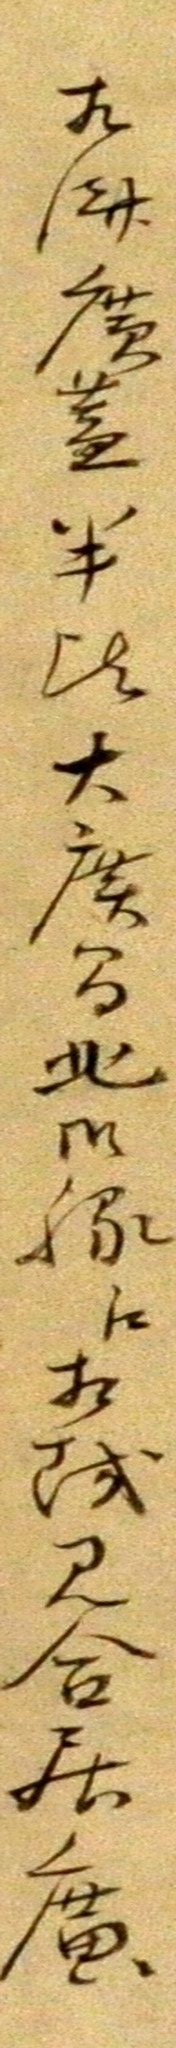相済廣蓋半頃大廣間北御縁え相越見合居廣
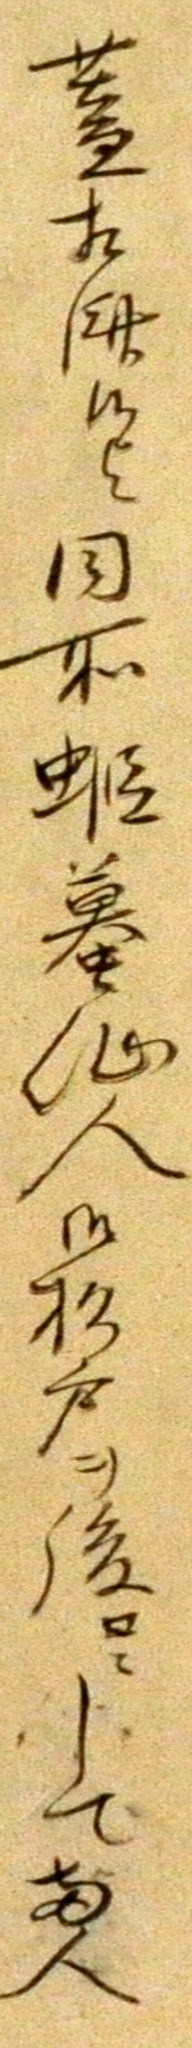蓋相済候ゟ同所蝦蟇仙人御杦戸ヲ後ロニして両人
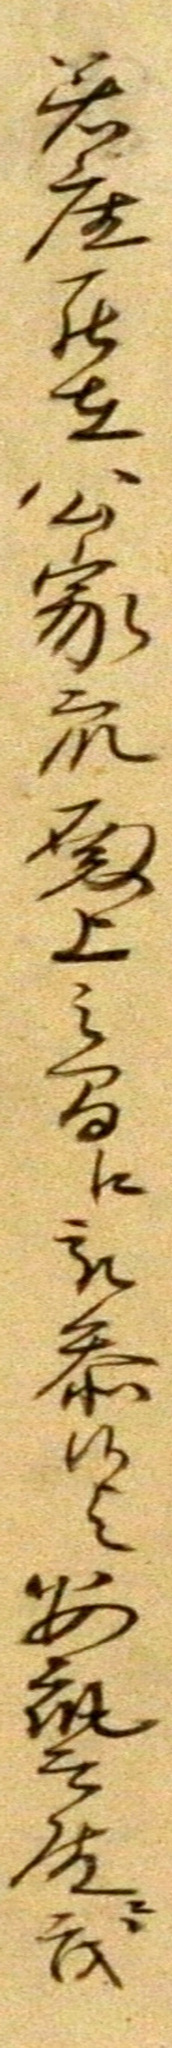着座罷在公家衆殿上之間え被参候ゟ安藝殿にも
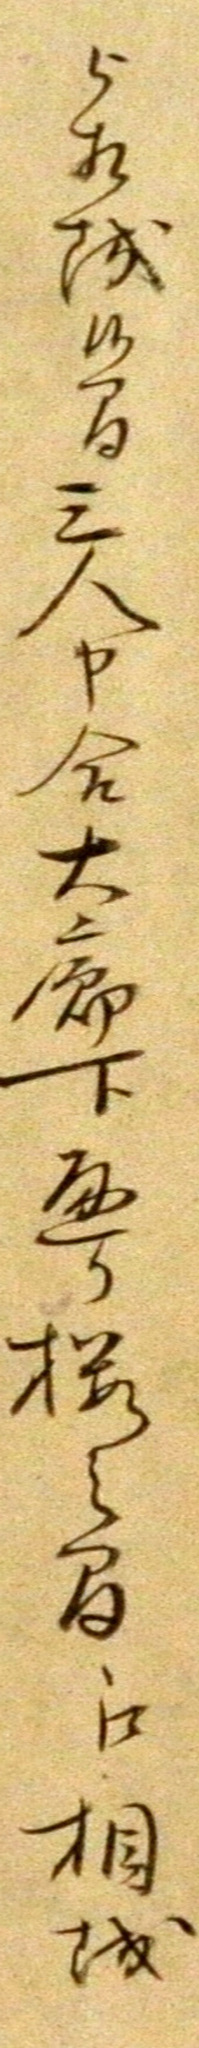被相越候間三人申合大廊下通り桜之間え相越
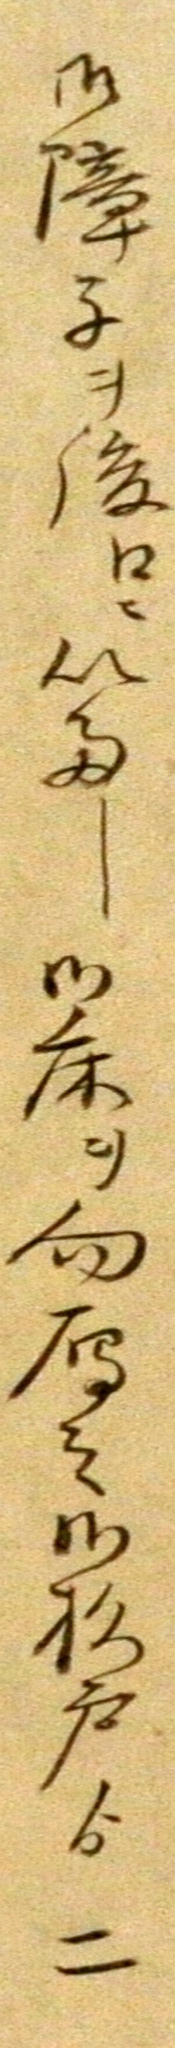御障子ヲ後ロニいたし御床ヲ向鳫之御杦戸ゟ二
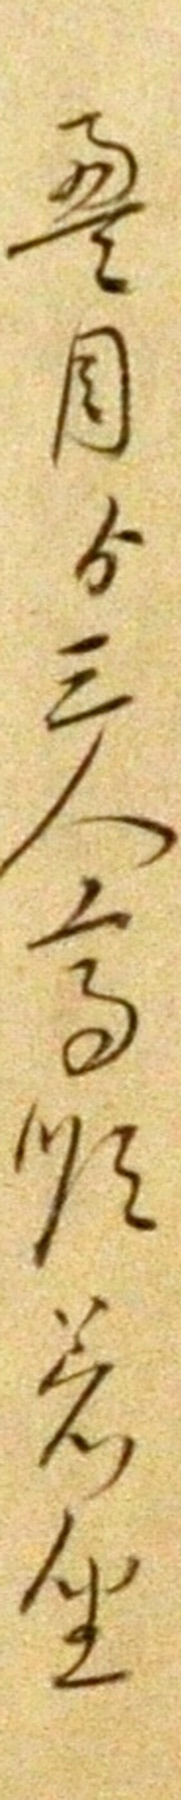畳目ゟ三人高順着座
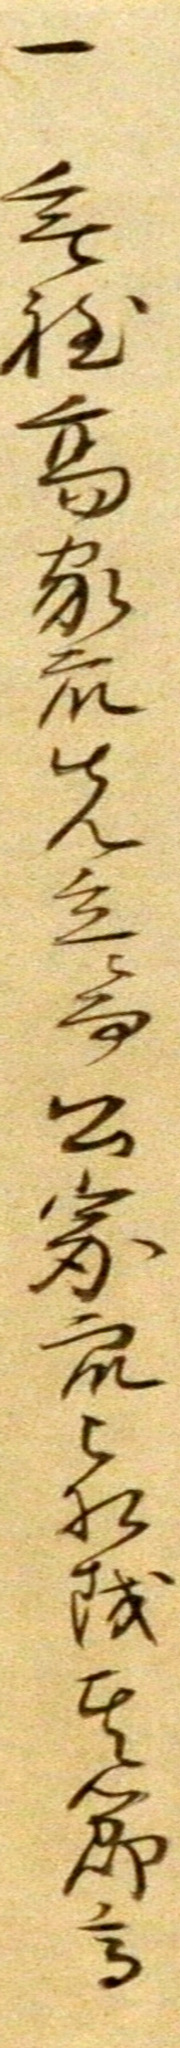一無程高家衆先立ニ而公家衆被相越其節高
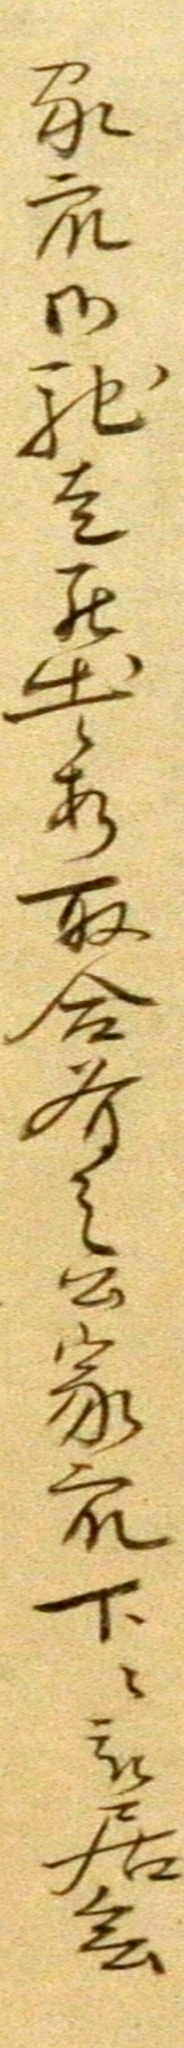家衆御馳走罷出候段取合有之公家衆下ニ被居会

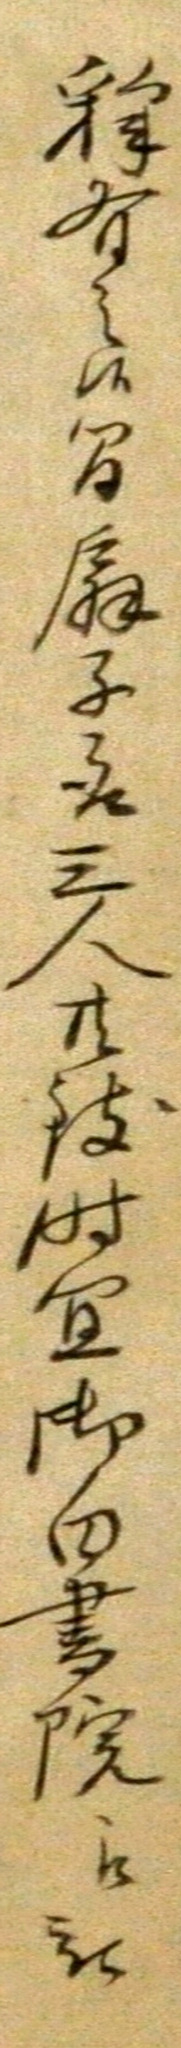釋有之候間扇子取三人共致時宜御白書院え被
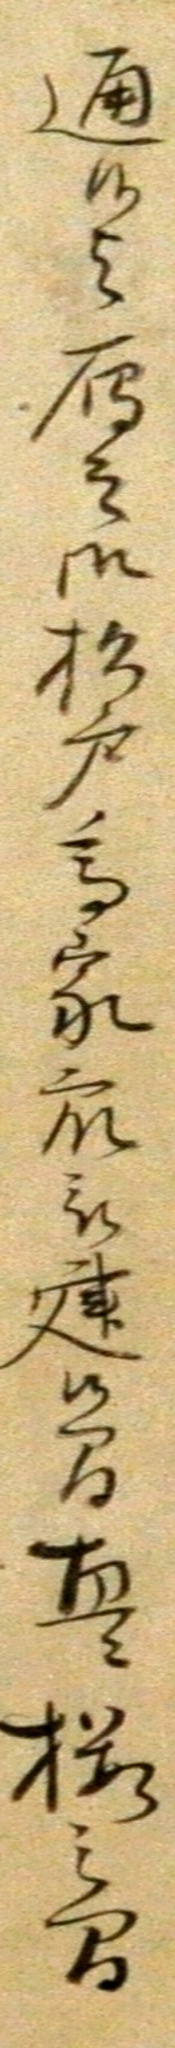通候と鳫之御杦戸高家衆被建候間直ニ桜之間
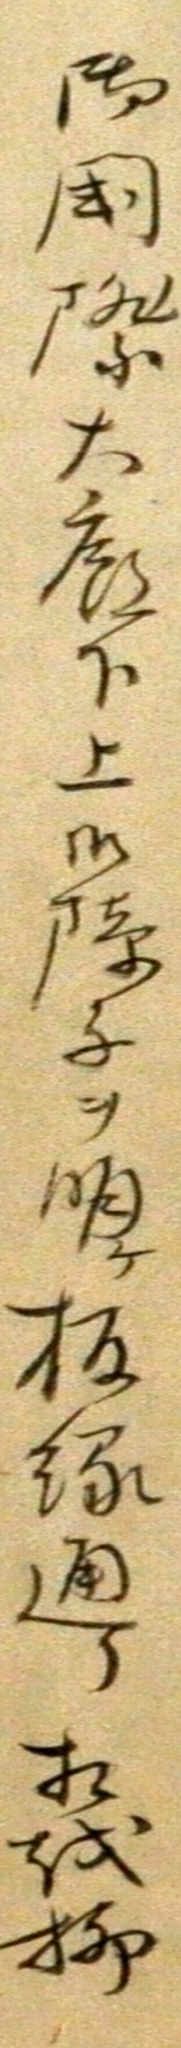御閾際大廊下上御障子を明ケ板縁通り相越栁
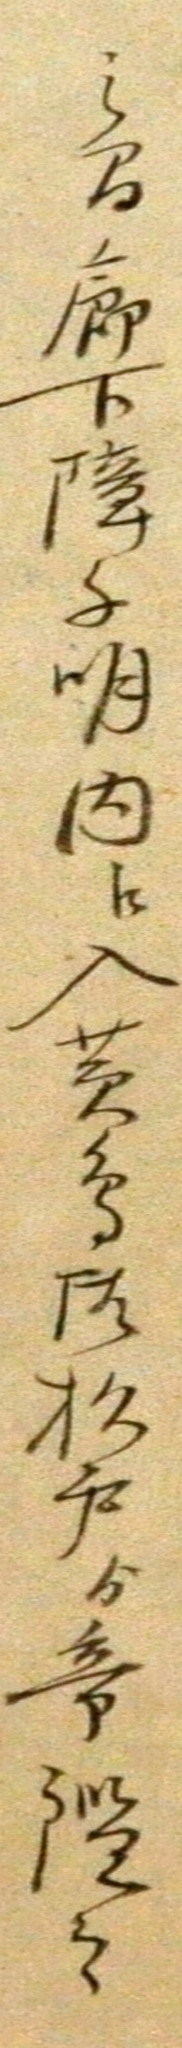之間廊下障子明内え入黄鳥御杦戸ゟ帝鑑之
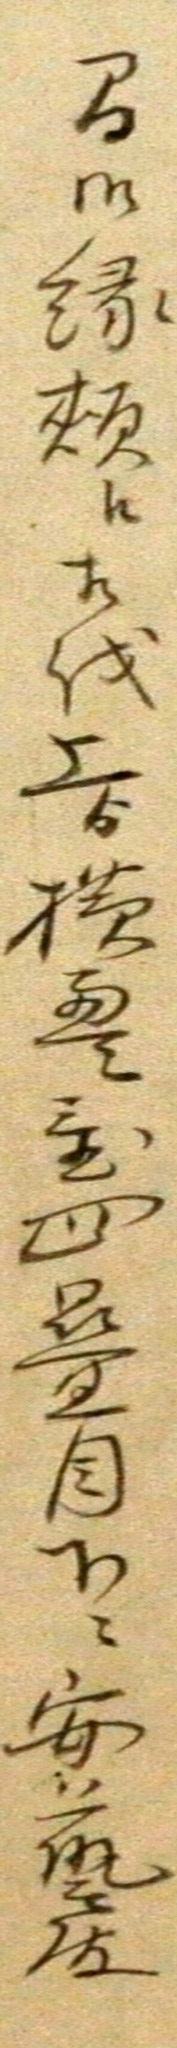間御縁頬え相越上ゟ横畳置四畳目下ニ安藝殿
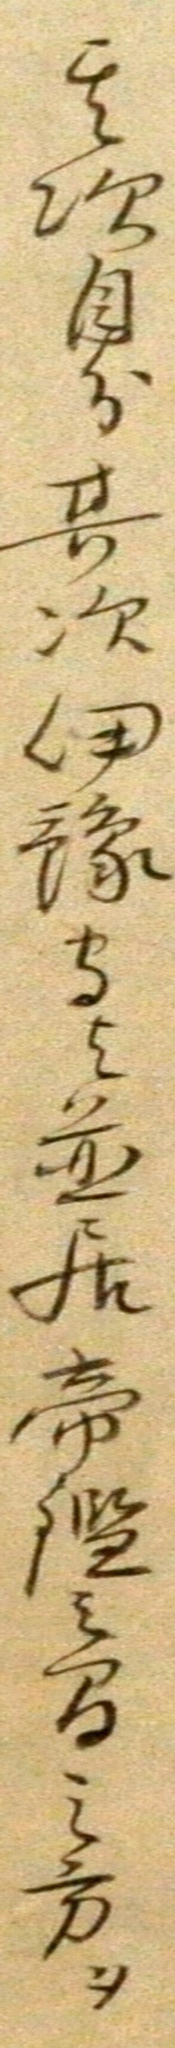其次自分其次伊豫守と並居帝鑑之間之方ヲ
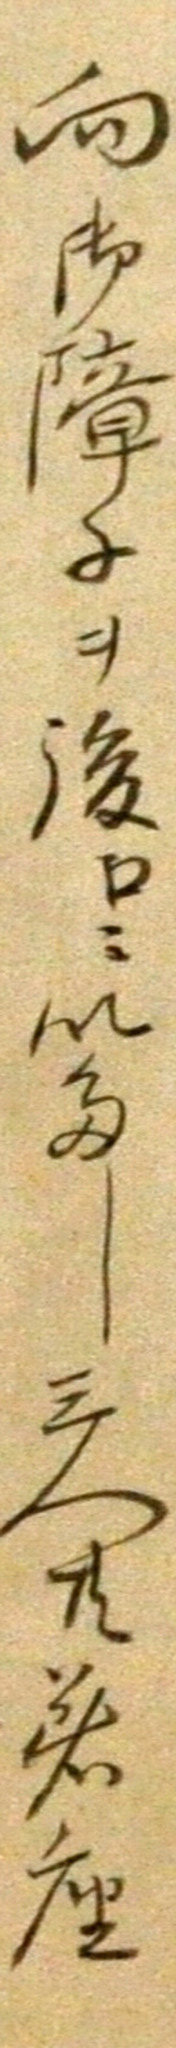向御障子ヲ後ロニいたし三人共着座
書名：御白書院御座席奉行勤方留外
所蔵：伊那市立高遠町図書館・合同会社AMANE
